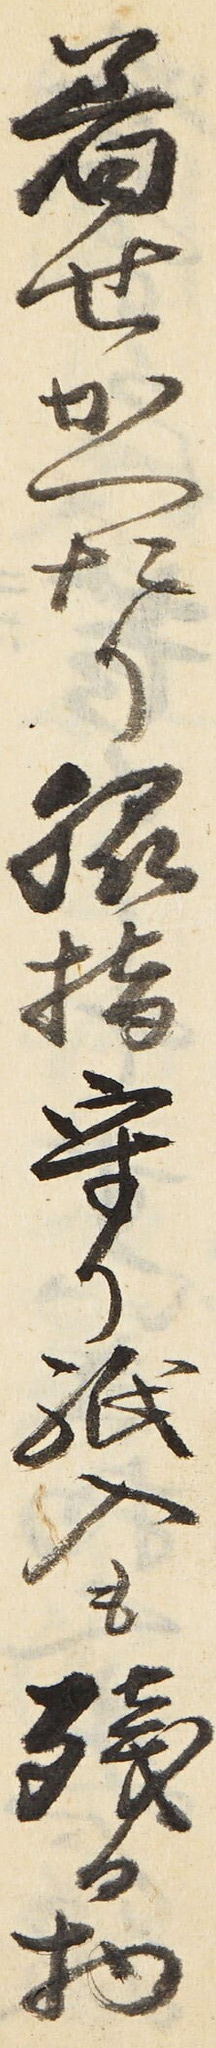着せかへたり脇指守り紙入も残る物
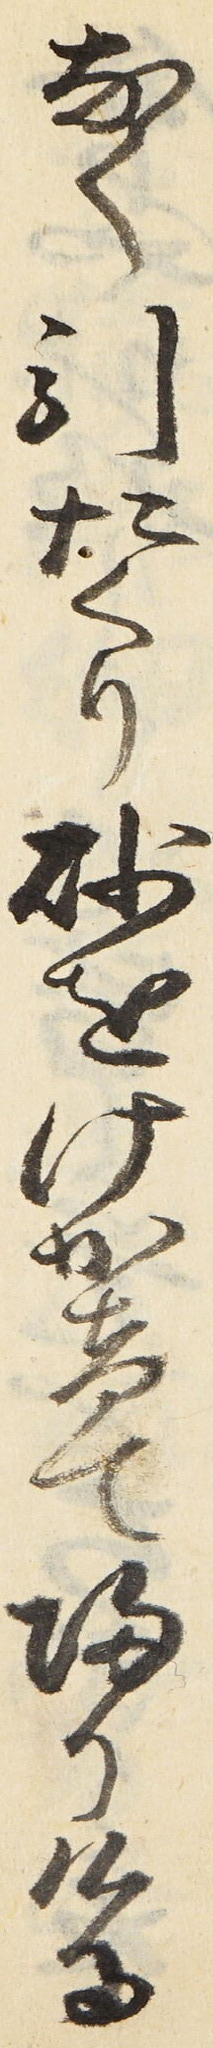なく引たくり砂をけかけて帰りける
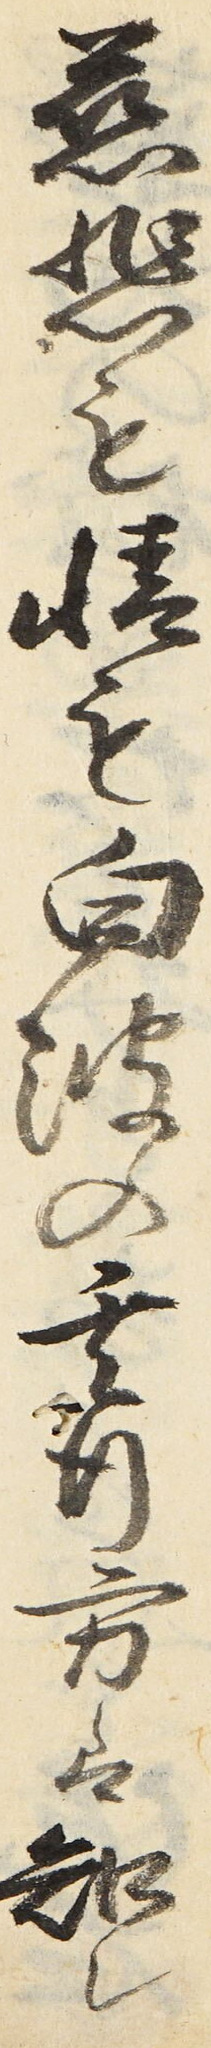慈悲も情も白波の其行方は知れ
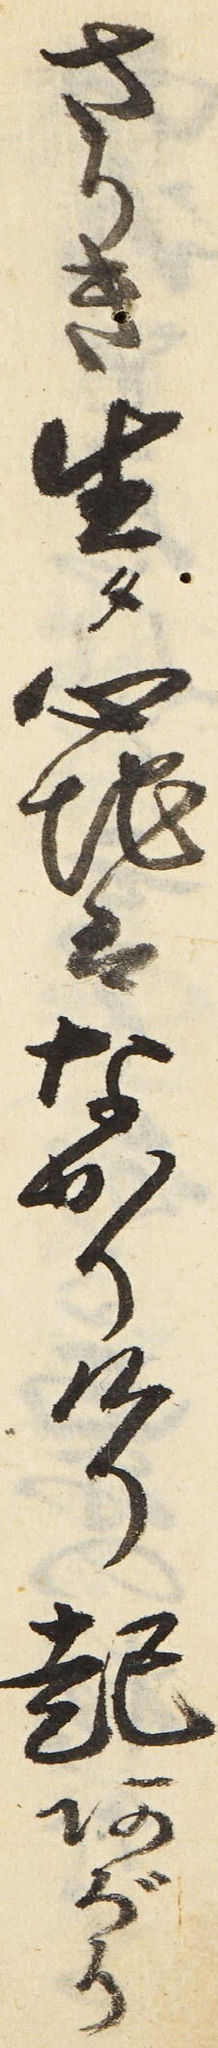さりき生た心地はなかりけり起あがり
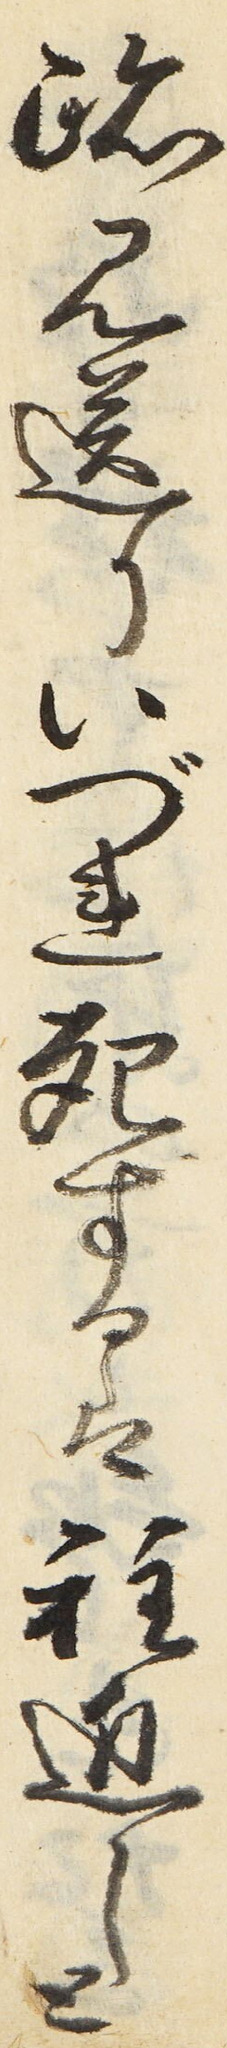跡見送りいづれ死するは程近しと
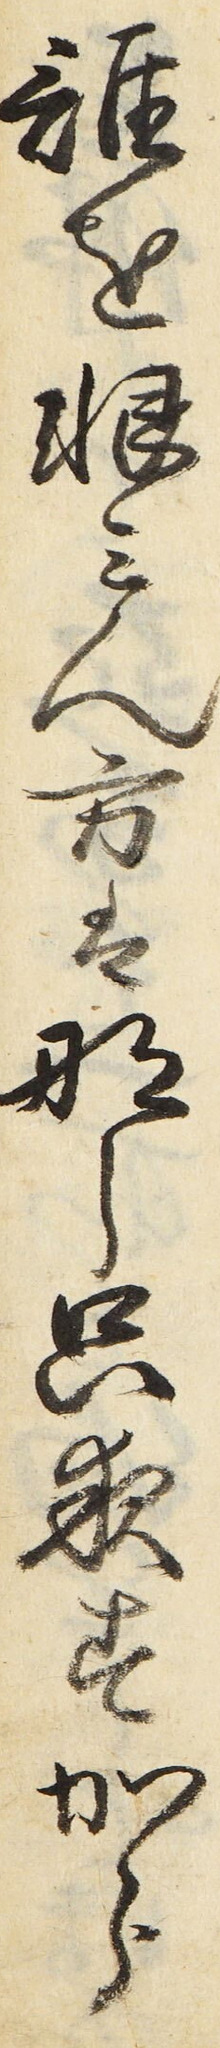難を恨みん方はなし只夜すから

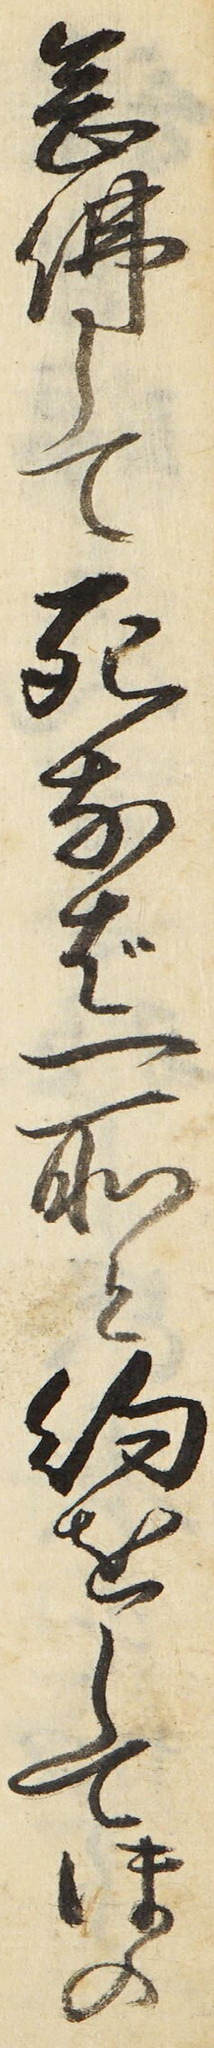念佛して死なば一所と約をしてほの
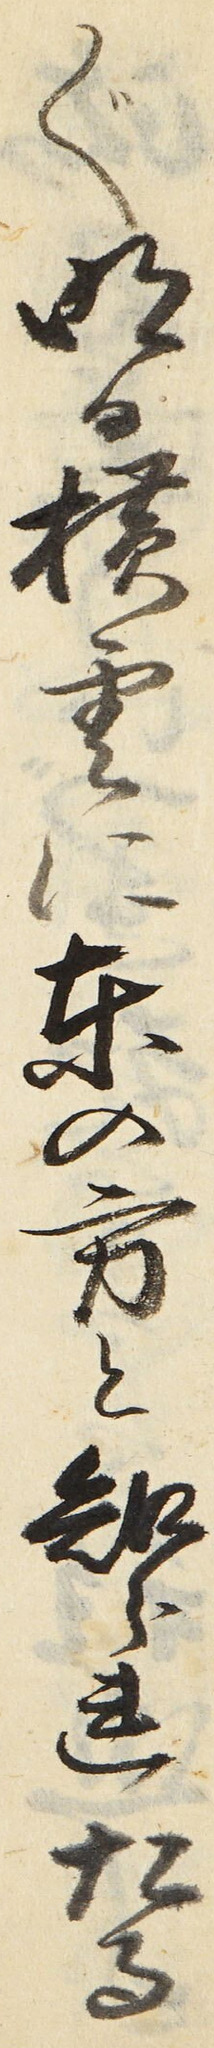〴〵明る横雲に東の方と知られたる
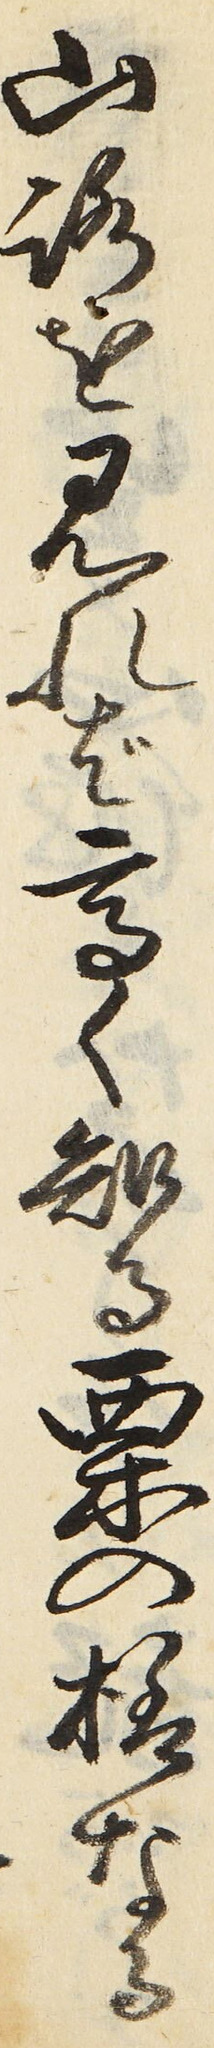山路を見れば高く知る栗の様なる
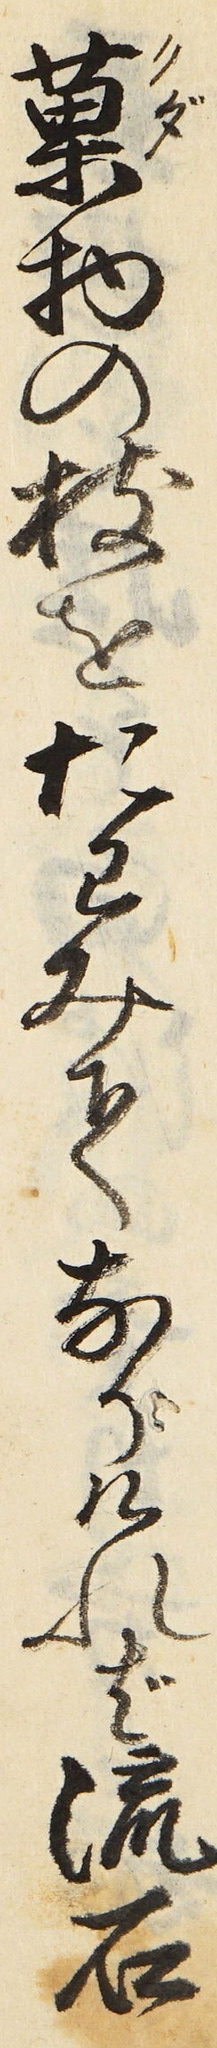菓物の枝をたわみてなりければ流石
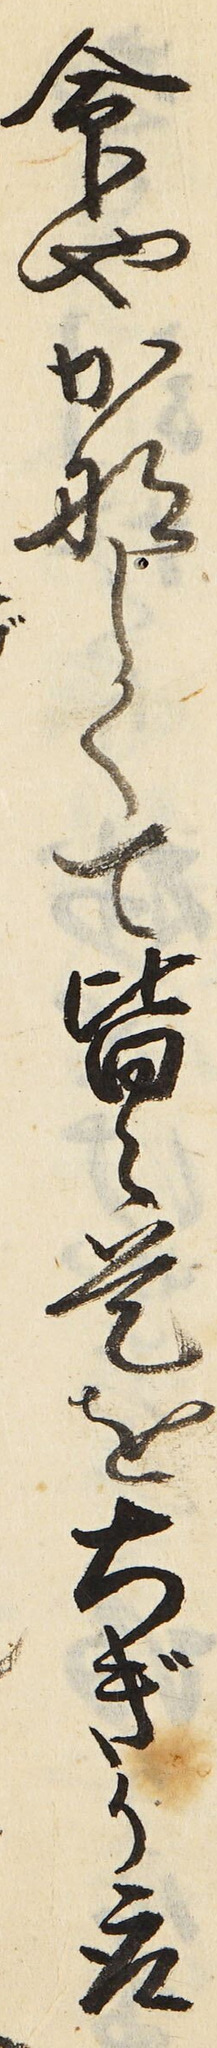命やかなしくて皆々是をちぎり取
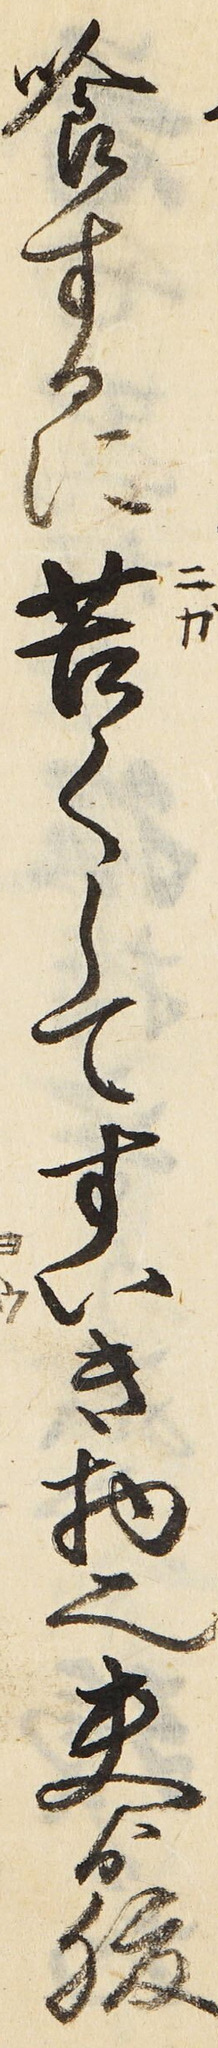喰するに苦くしてすいき物也夫ゟ腹
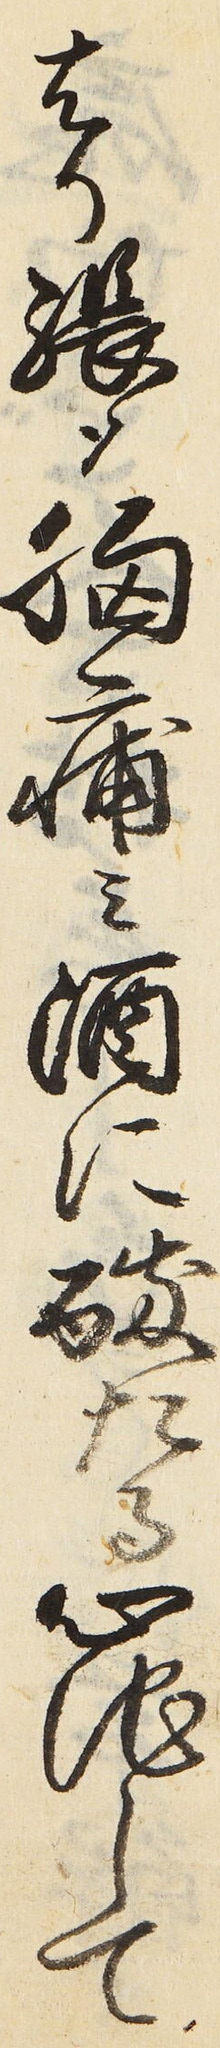はり張〆胸痛み酒に酔たる心地して
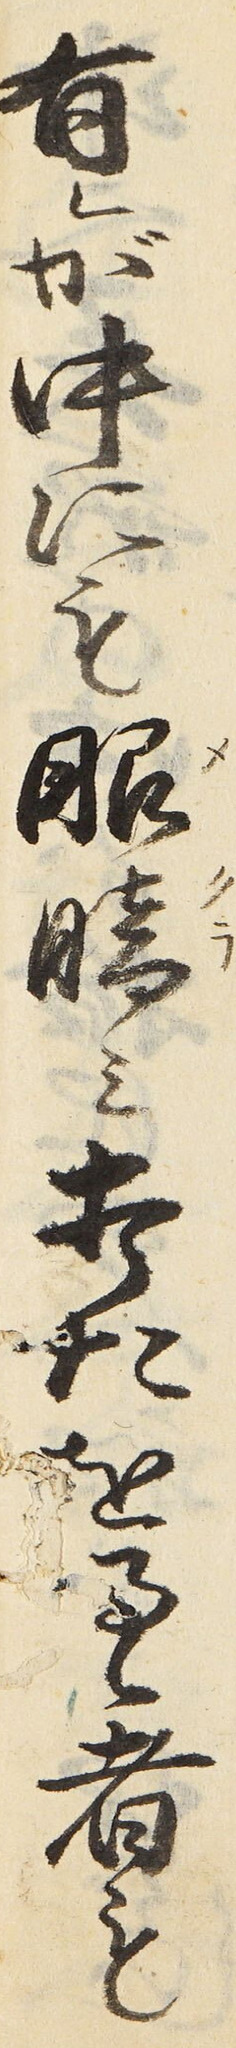有れが中にも眼眩み打たをるゝ者も
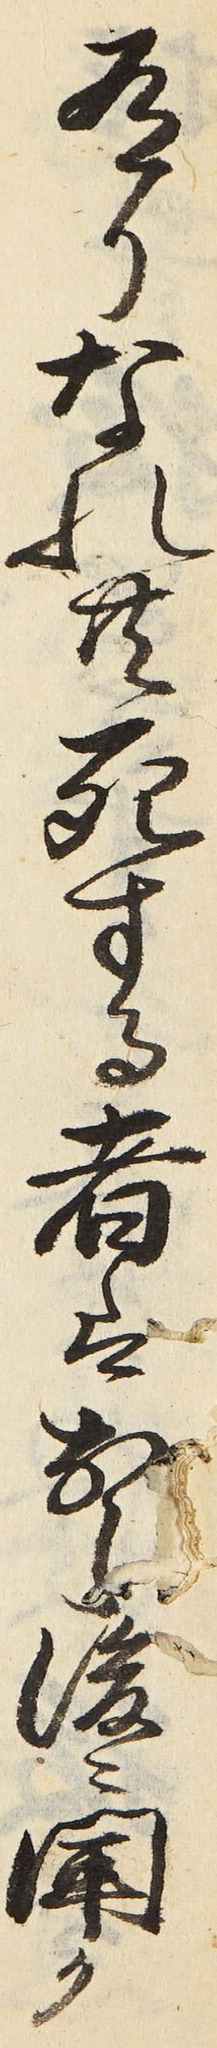有りなれ共死する者はなし後に聞く
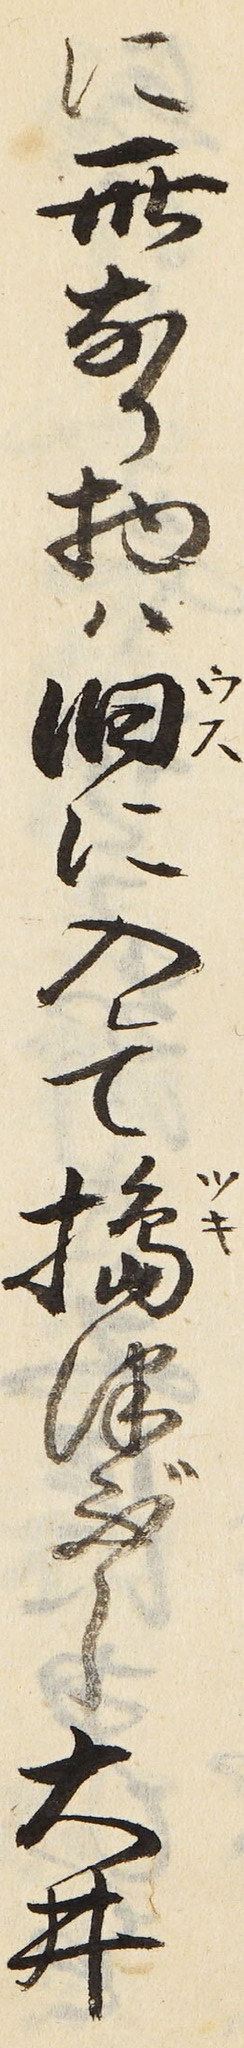に此なり物は臼に入れて搗つぶし大井
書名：華夷九年録
